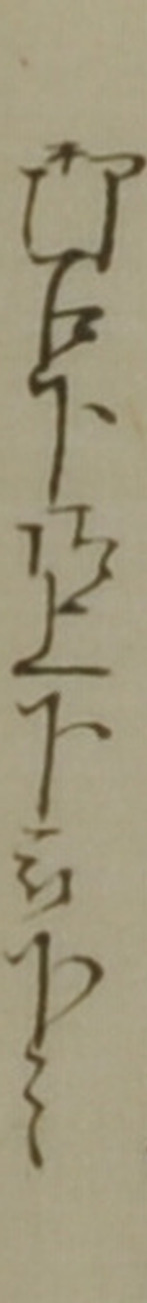御召下御上下被下之
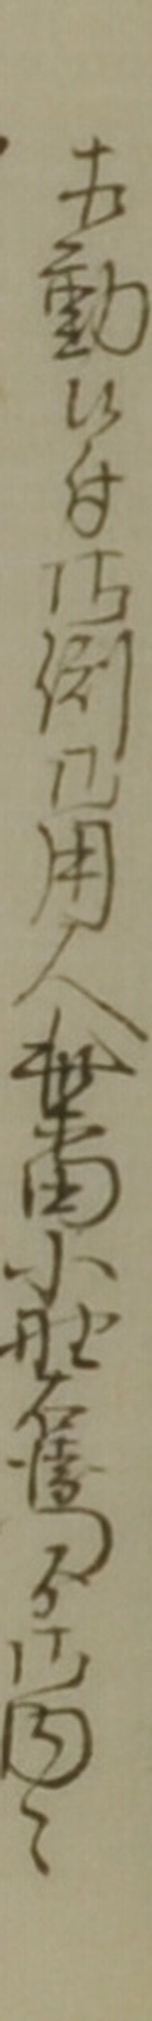相勤候付御側御用人柴田小野右衛門ゟ御内々
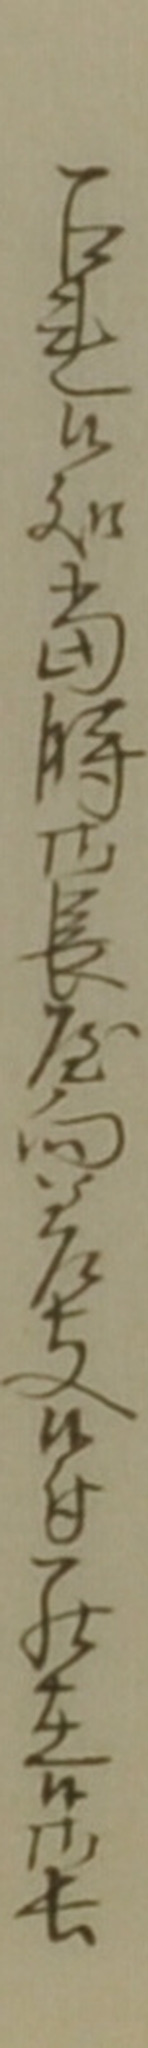召連候処当時御長屋向差支候付罷在候御長
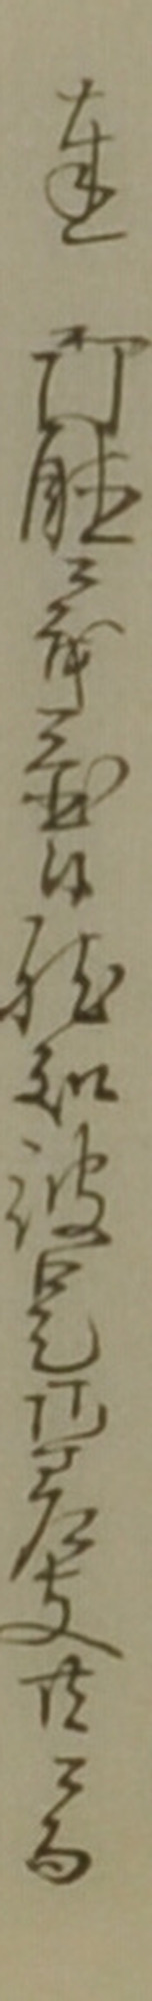達御聴ニ茂置候然処彼是御差支共ニ而
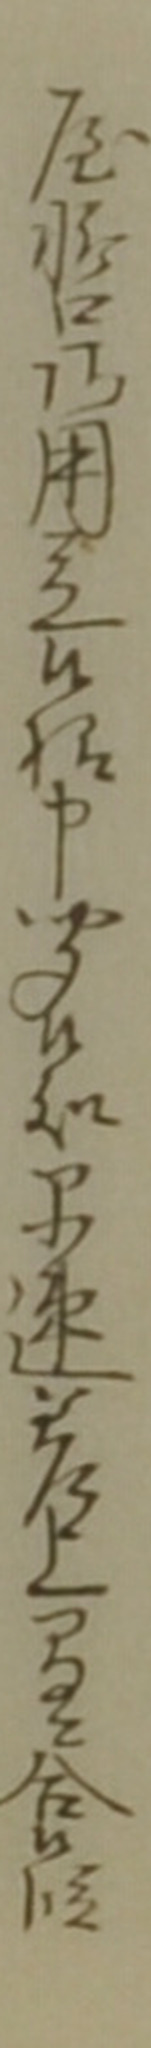屋暫御用立候様申聞候処早速差上間ニ合候段
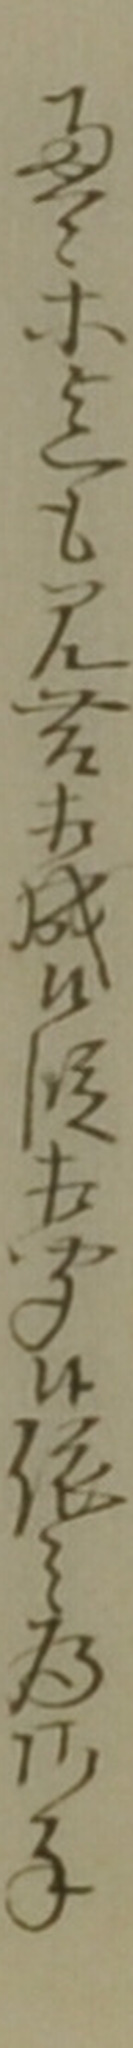畳等迄も見苦相成候段相聞候依之為御手
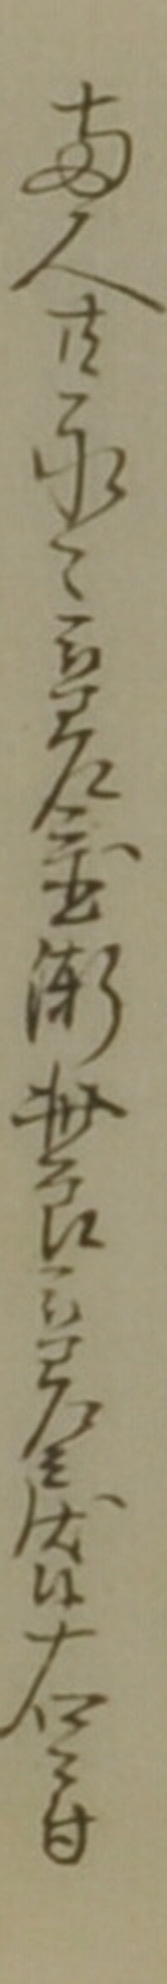両人共永々被差置漸此節被差戻候右ニ付
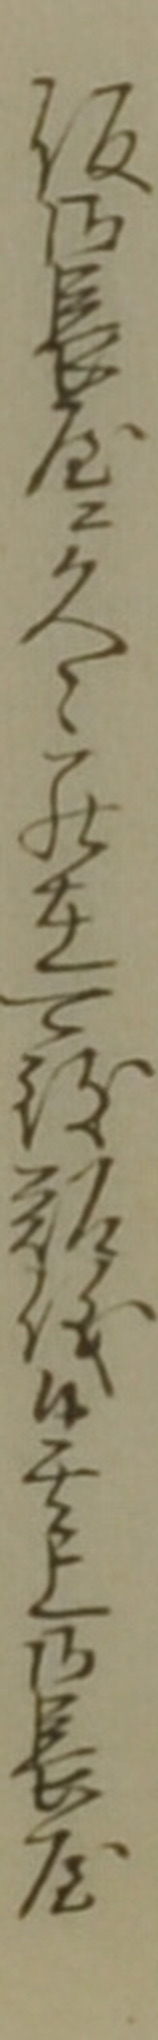仮御長屋久々罷在可致難儀候其上御長屋
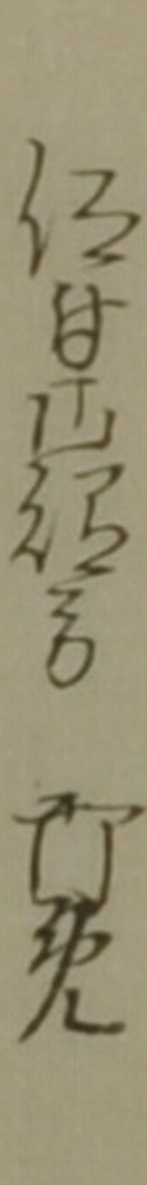仰付御賄方御免
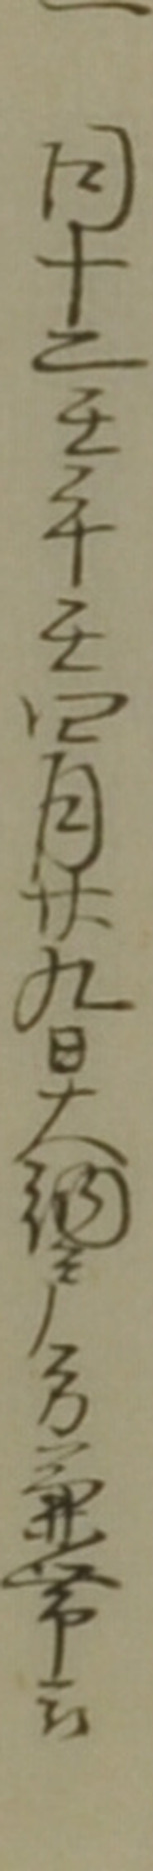一同十二壬午閏四月廿九日大納戸方兼帯被
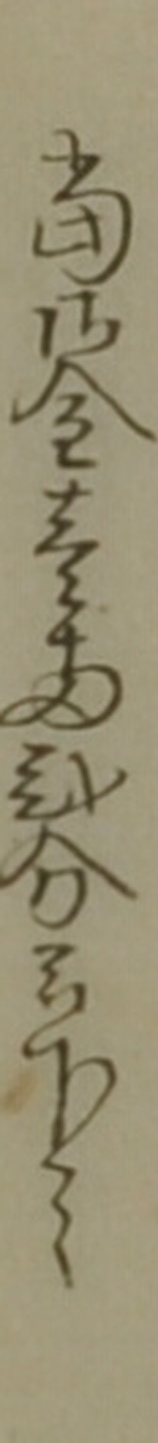当御金壱両弐分被下之
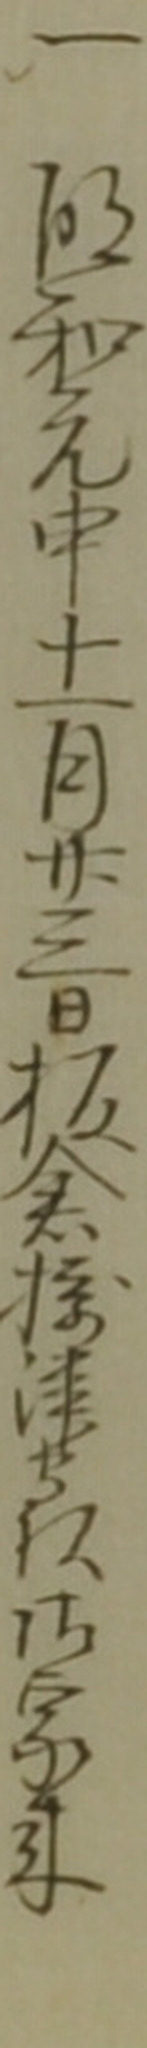一明和元申十一月廿三日板倉摂津守様御家来
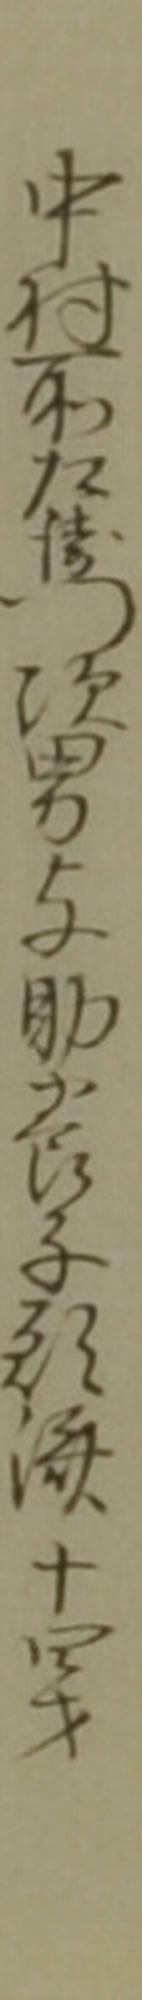中村所左衛門次男与助養子願済十四才
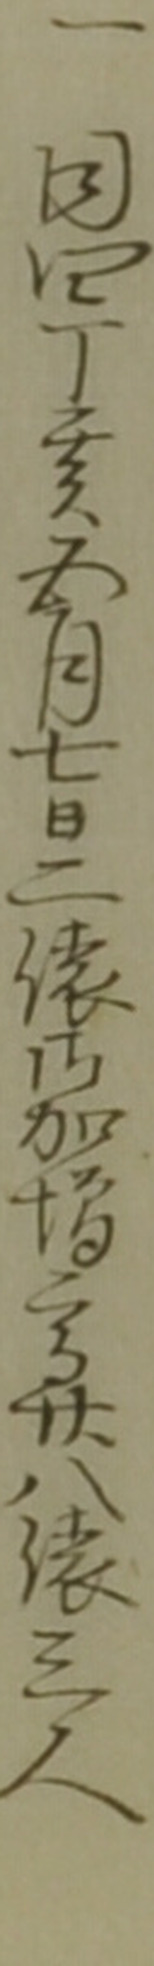一同四丁亥五月七日二俵御加増高廿八俵三人
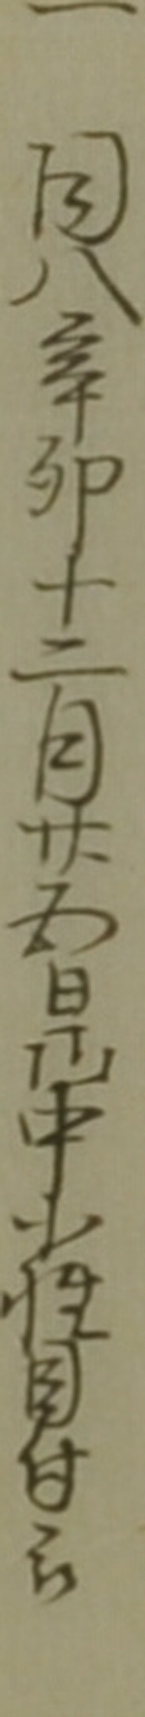一同八辛卯十二月廿五日御中小性目付被
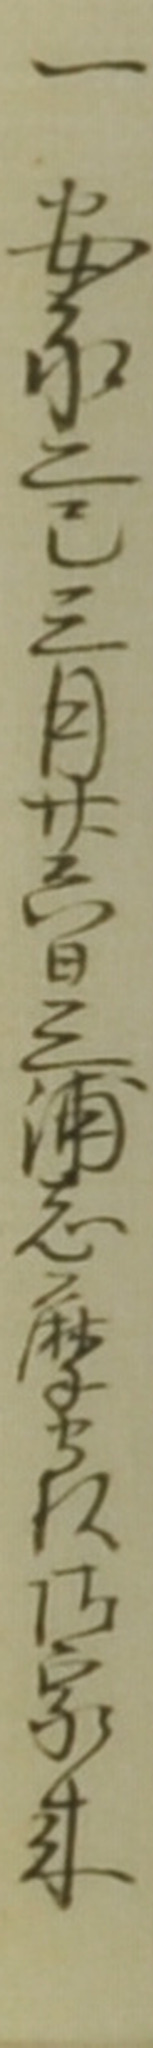一安永二巳三月廿六日三浦志摩守様御家来
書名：無足廃家（弐）
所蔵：伊那市立高遠町図書館・合同会社AMANE
